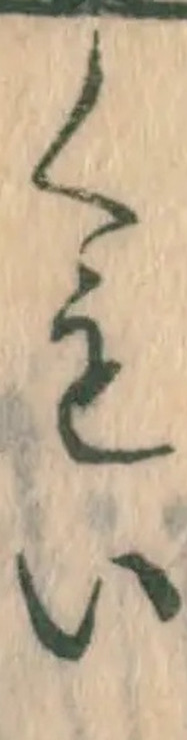くもい
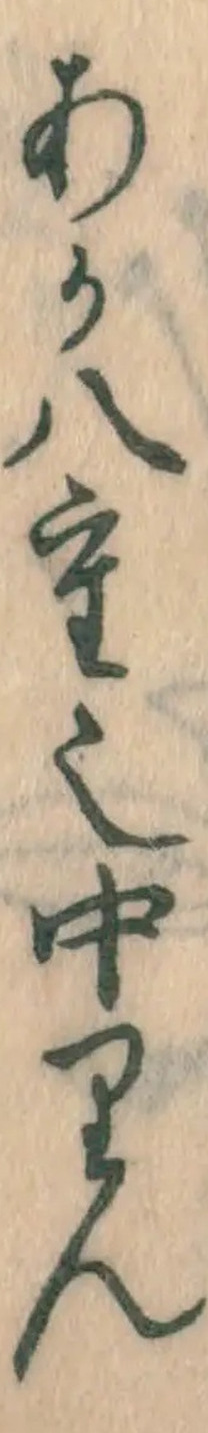あか八重也中りん

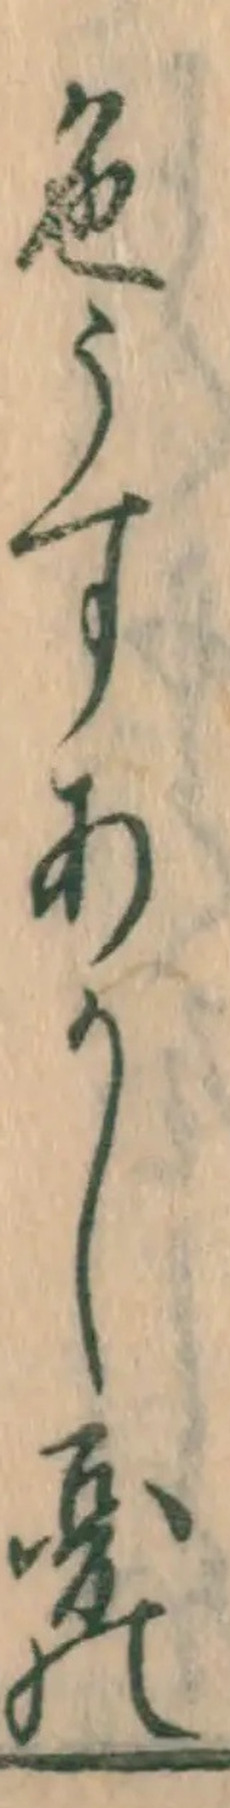色うすあかし図の
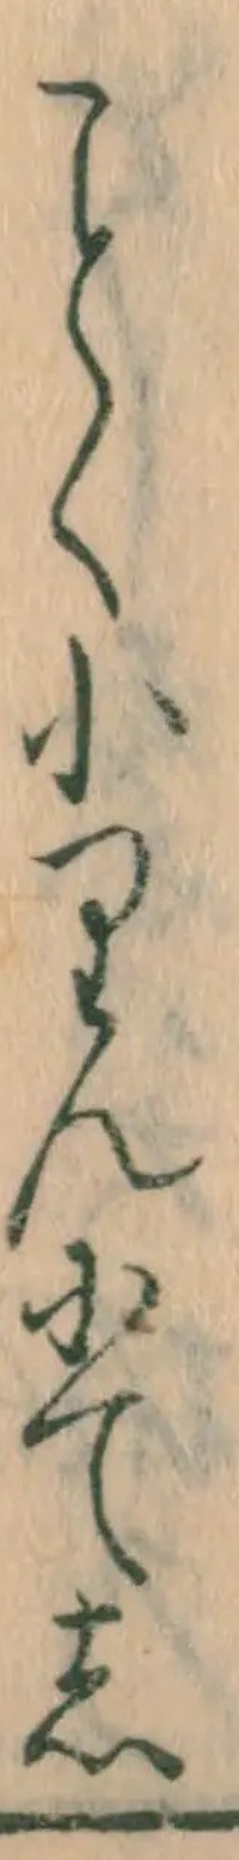ことく小りんにてし
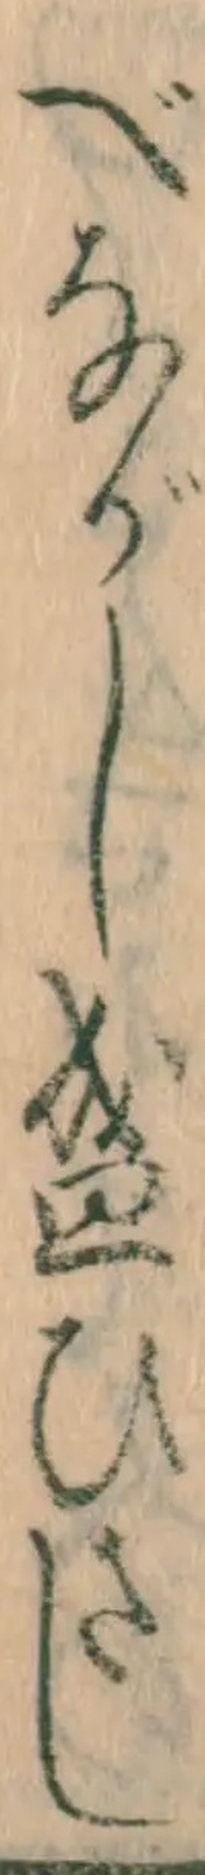べながし盛ひさし
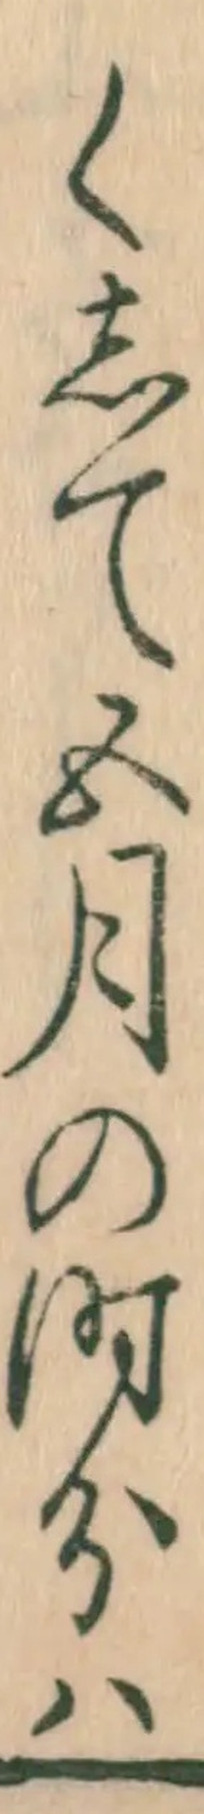くして五月の時分は
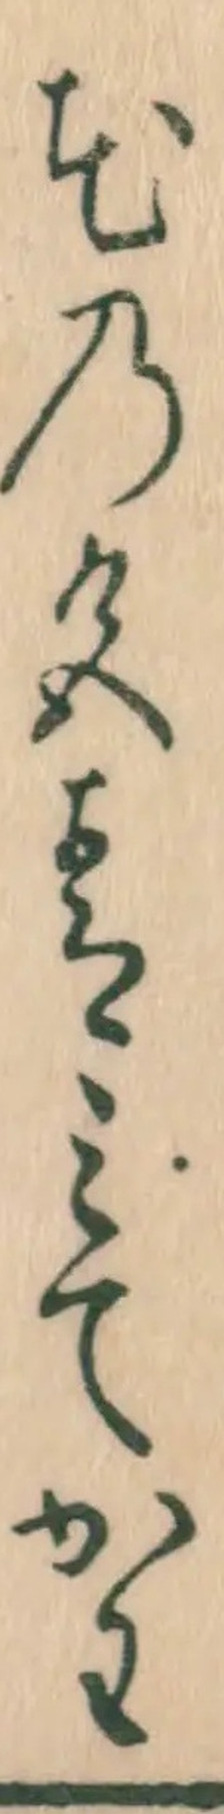花の色青みてかわ
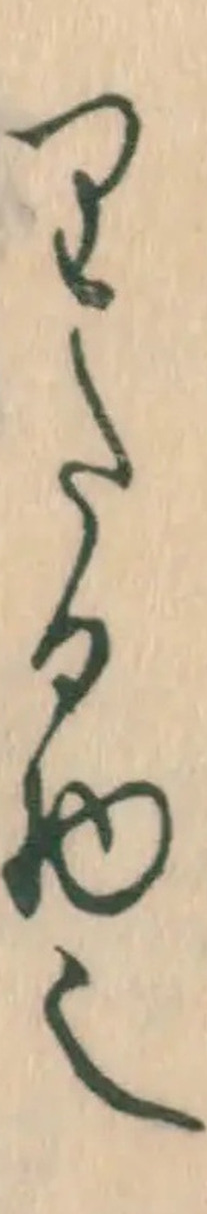りたる物形
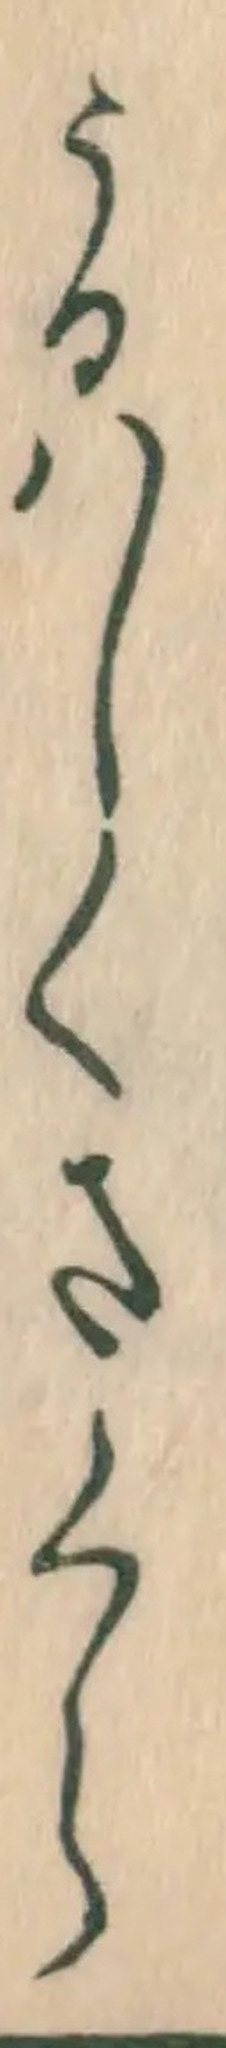うるはしくさくら
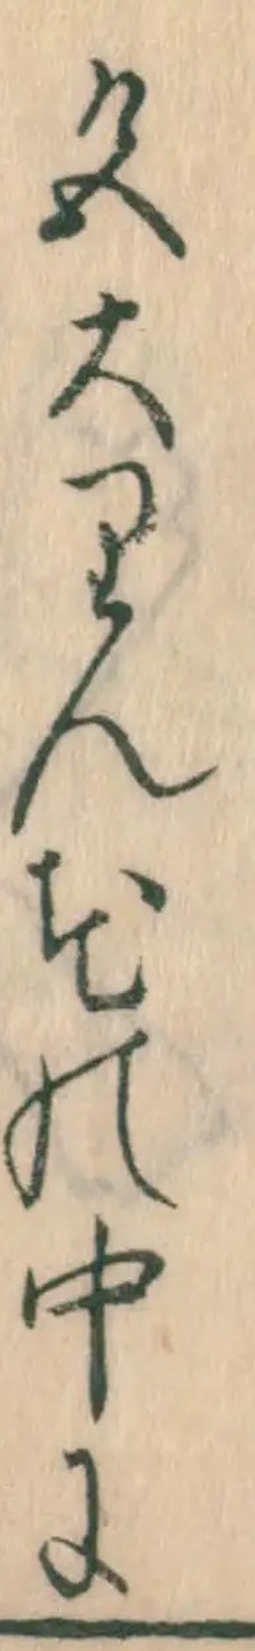色大りん花の中に
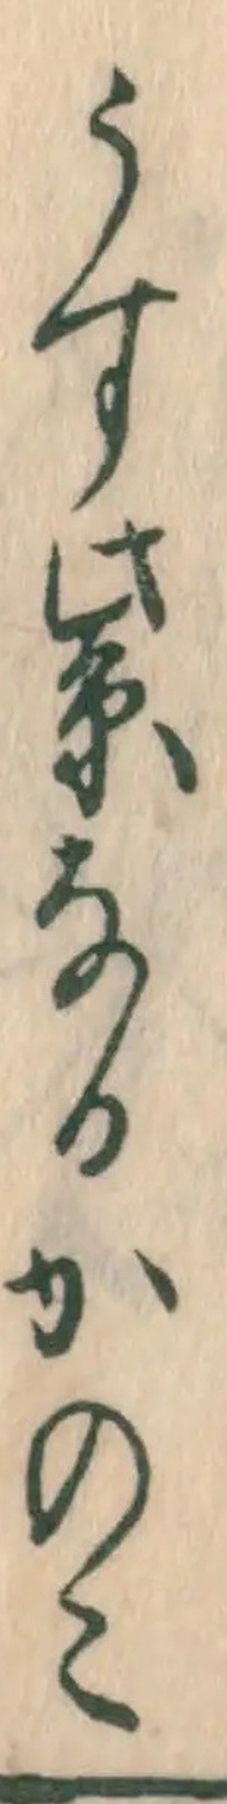うす紫なるかのこ

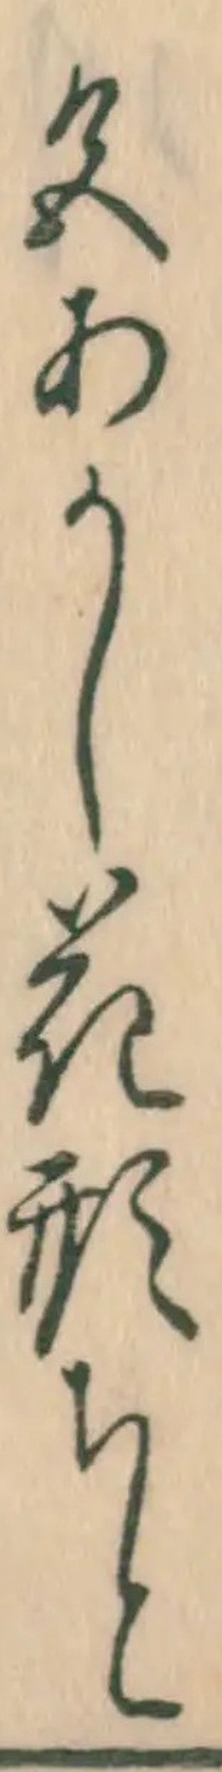色あかし花形ちと
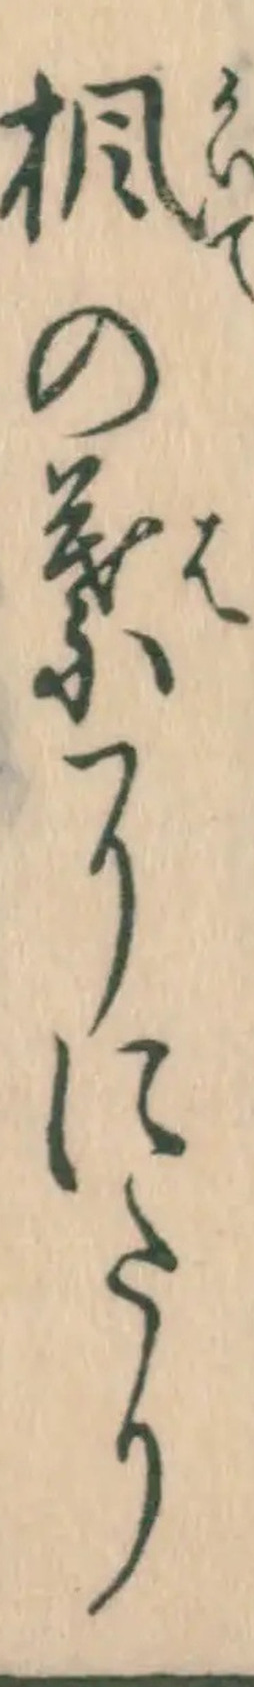楓の葉ににたり
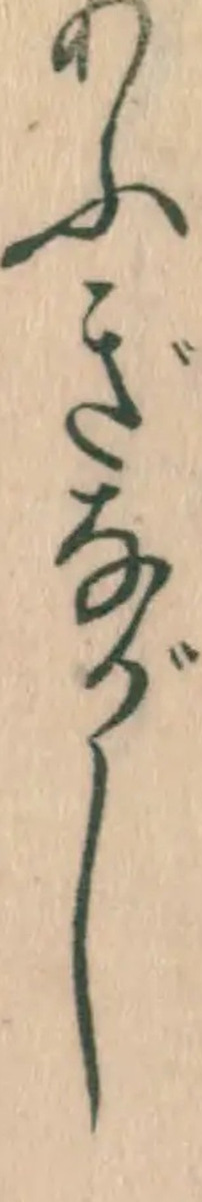あふぎながし
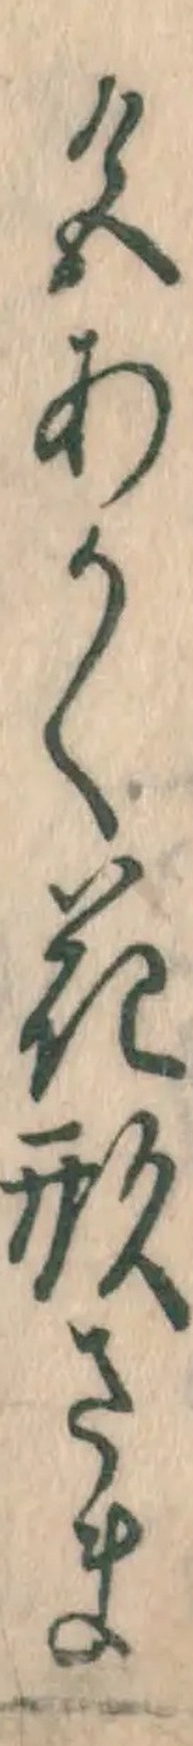色あかく花形さま

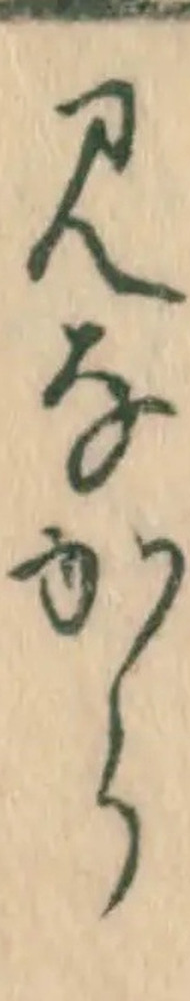みながら
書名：錦繍枕 5巻. [2]
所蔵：国立国会図書館 National Diet Library, JAPAN
